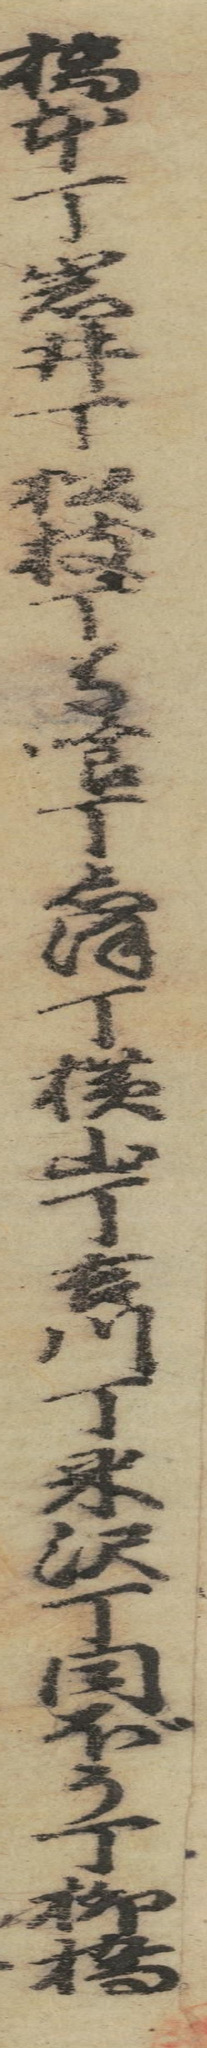橋本丁岩井丁松枝丁馬喰丁しほ丁横山丁吉川丁米沢丁同ぼう丁柳橋
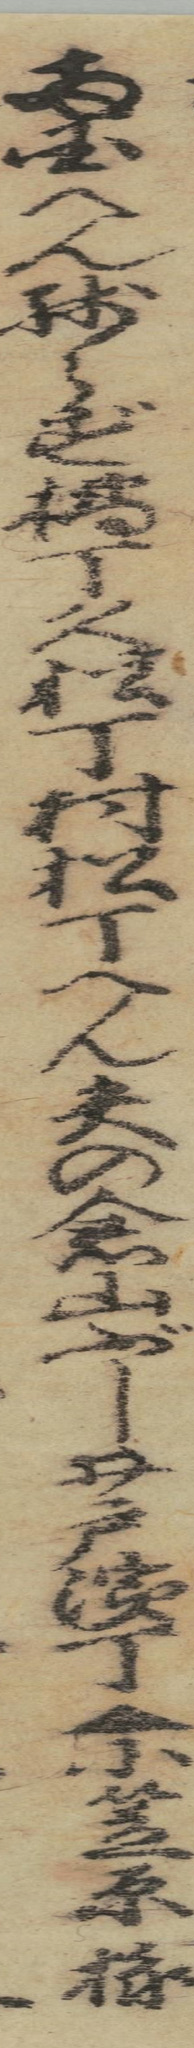両国へん残らず橘丁久松丁村松丁へん矢の倉山ぶし井戸浜丁▲小笠原様
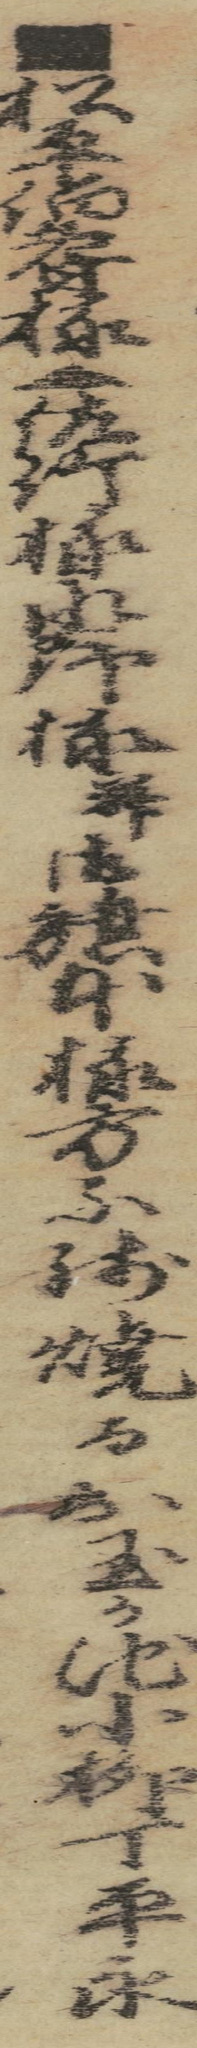松平伯耆様▲佐竹様水野様并御旗本様方不残焼るお玉か池小柳丁平永
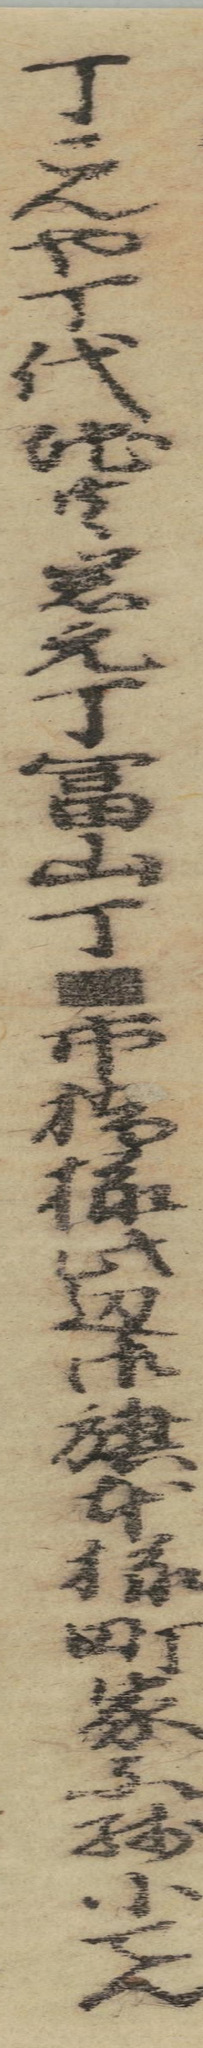丁こんや丁代地共岡本丁富山丁市橋様此辺御旗本様町家不残小てん
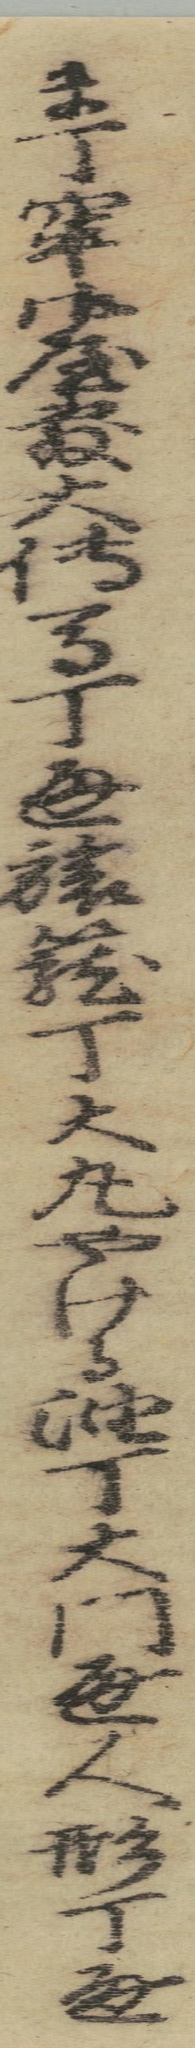ま丁牢御屋敷大伝馬丁通旅籠丁大丸やける油丁大門通人形丁通
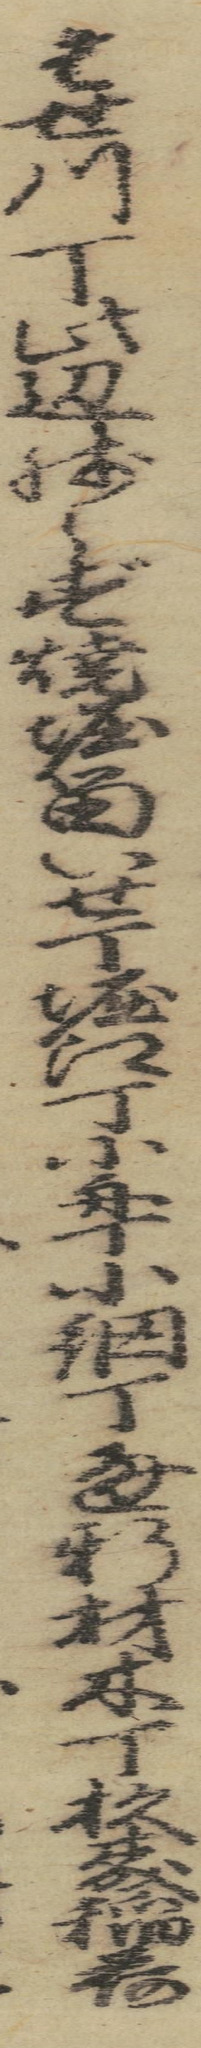はせ川丁此辺残らず焼堀留いせ丁堀江丁小舟丁小網丁通新材木丁杉森稲荷
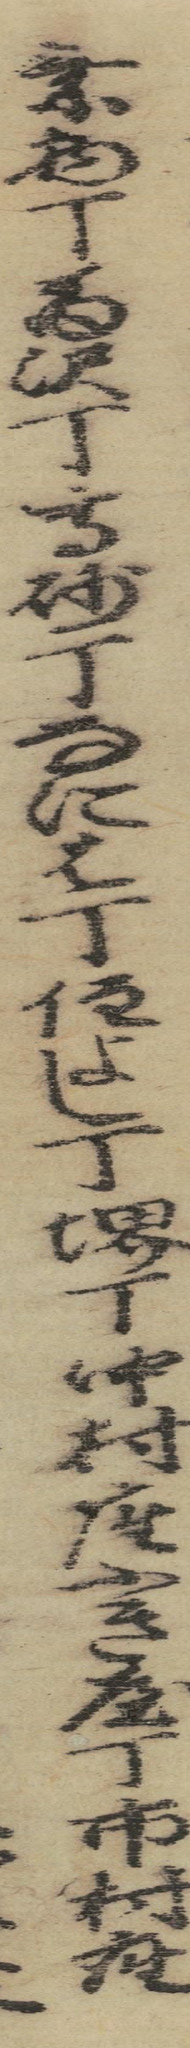乗物丁留沢丁高砂丁なには丁住よし丁堺丁中村座ふき屋丁市村座
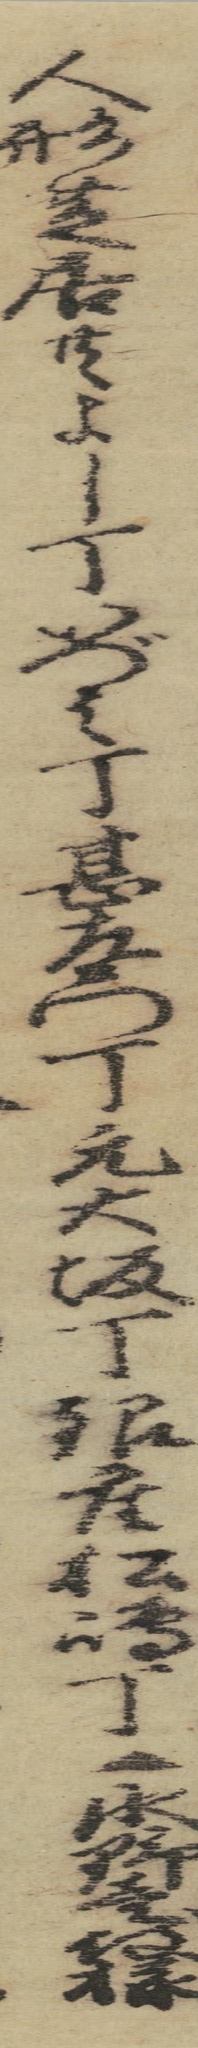人形芝居共よし丁いづみ丁甚左衛門丁元大坂丁銀座松崎丁▲水野壱岐様
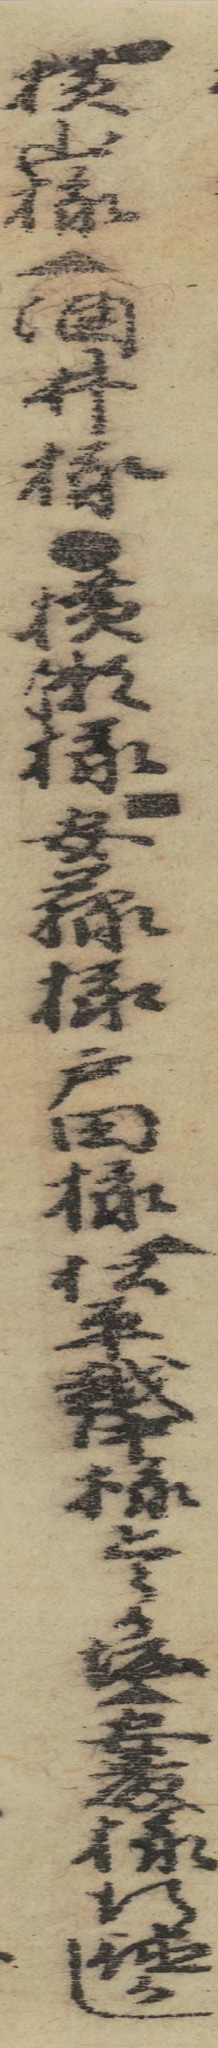●横山様▲酒井様●横瀬様安藤様戸田様▲松平越中様とうか堀▲安藤様行徳かし
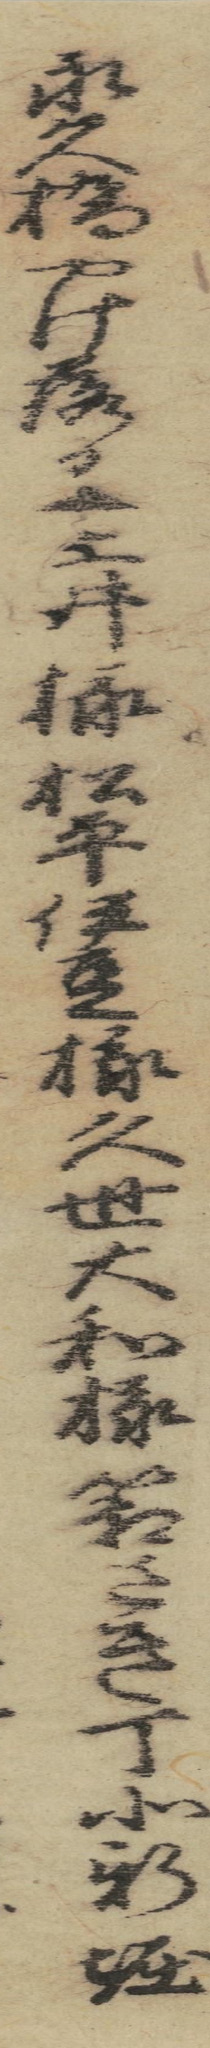永久橋やけ落る▲土井様松平伊豆様久世大和さま箱さき丁北新堀
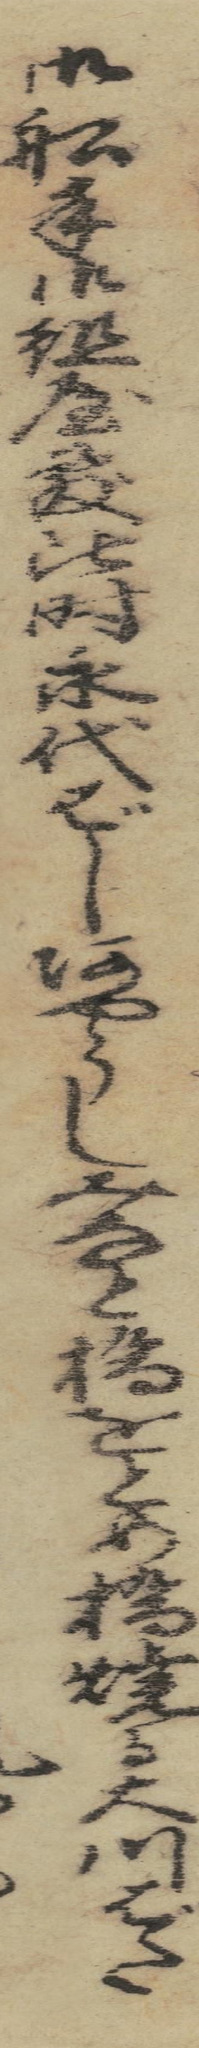御舟手御組屋敷此時永代ばしあやうしみると橋をとめ橋焼る大川ばた
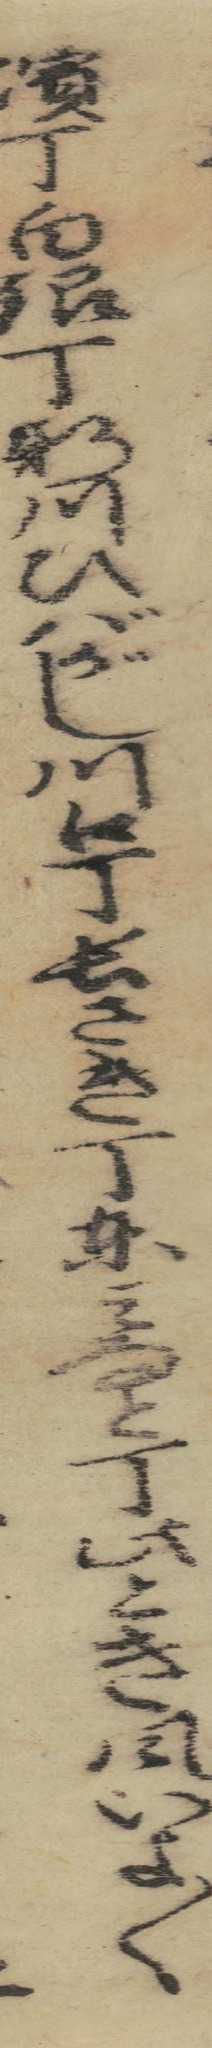浜丁白銀丁邪川ひばがし川口丁長さき丁本みなと丁此とき風いよ〳〵
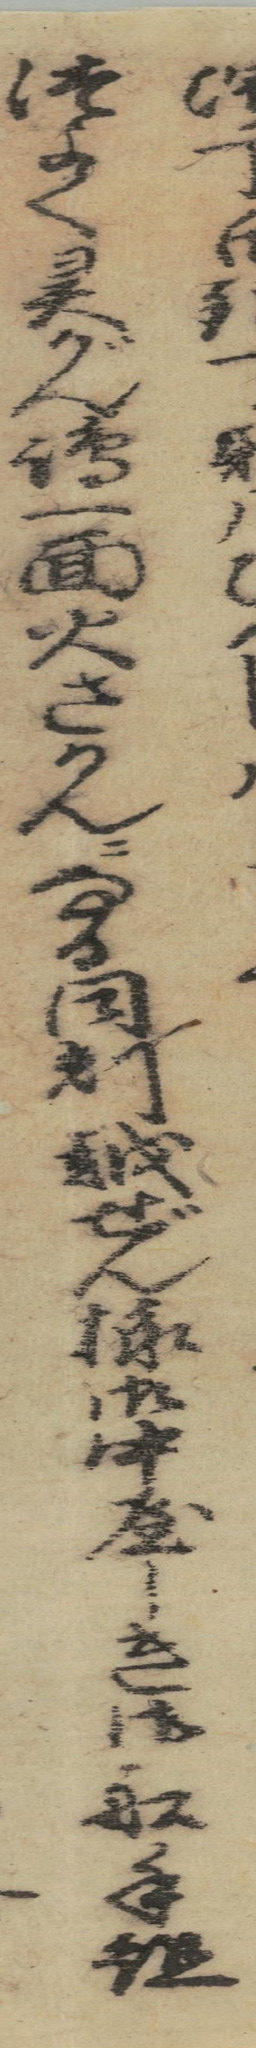つよく霊がん嶋一面火さかん二なる同刻越ぜん様御中やしき御船手組
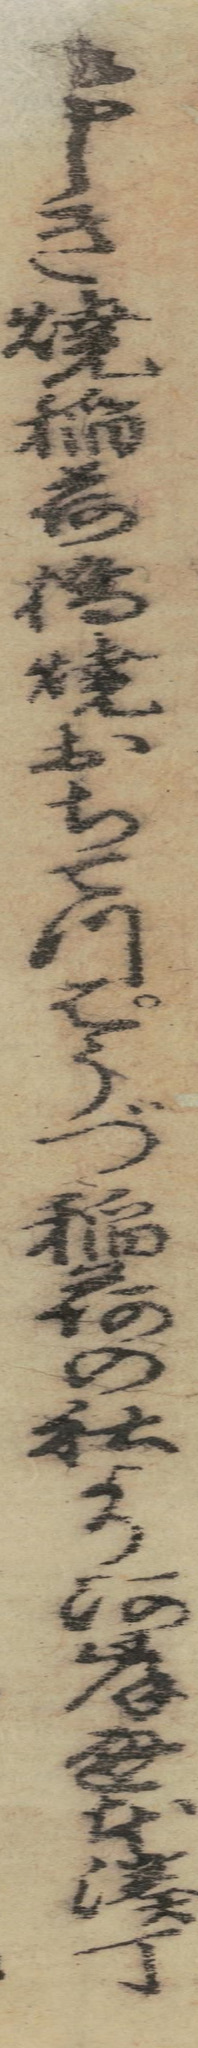御やしき焼稲荷橋焼おちててつぽうづ稲荷の社より河岸通本湊丁
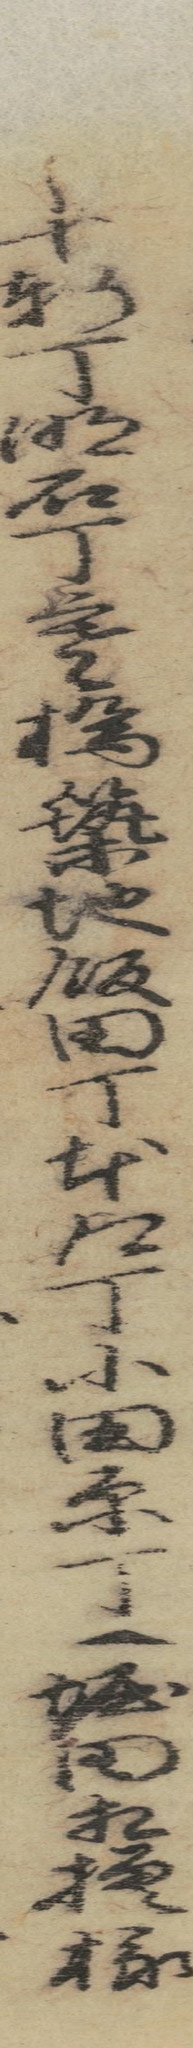十軒丁明石丁壱こく橋築地飯田丁本郷丁小田原丁▲堀田相模様
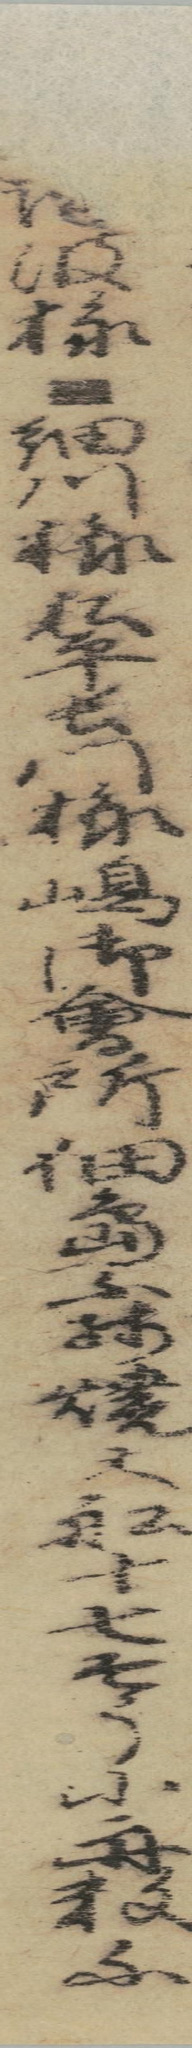波様細川様松平長門様嶋御会所佃嶋不残焼元船十七そう小舟数不
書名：方角場所附
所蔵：東京大学地震研究所図書室 Earthquake Research Institute Library, The University of Tokyo, JAPAN
